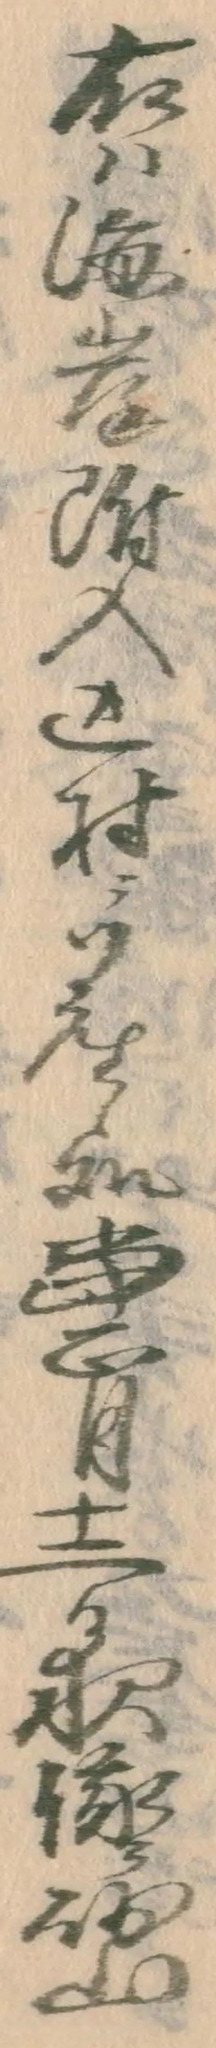右ハ海岸附入込村二御座候処当正月十二日夜俄二砂山
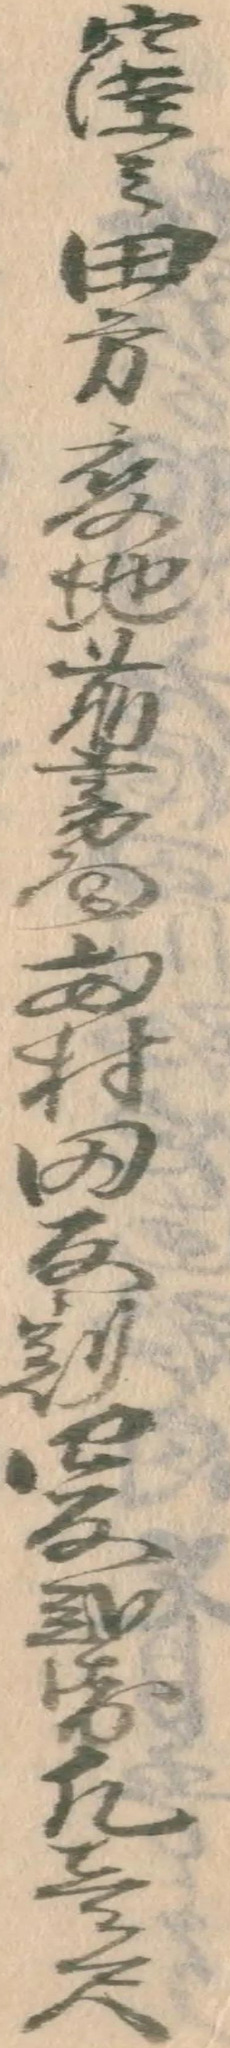窪ミ田方変地前書面両村田反割四反弐分凡壱尺
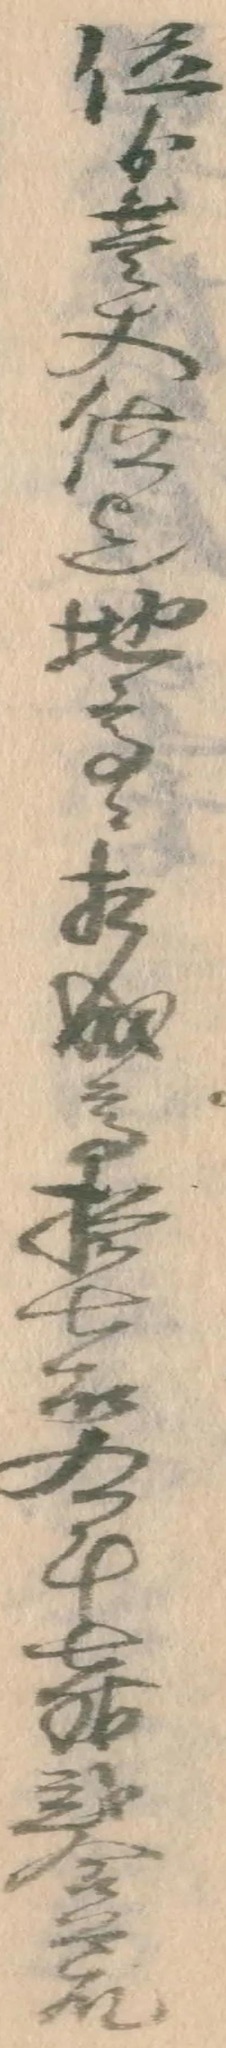位ゟ壱丈位迄地高に相成高拾七石九斗七升弐合荒
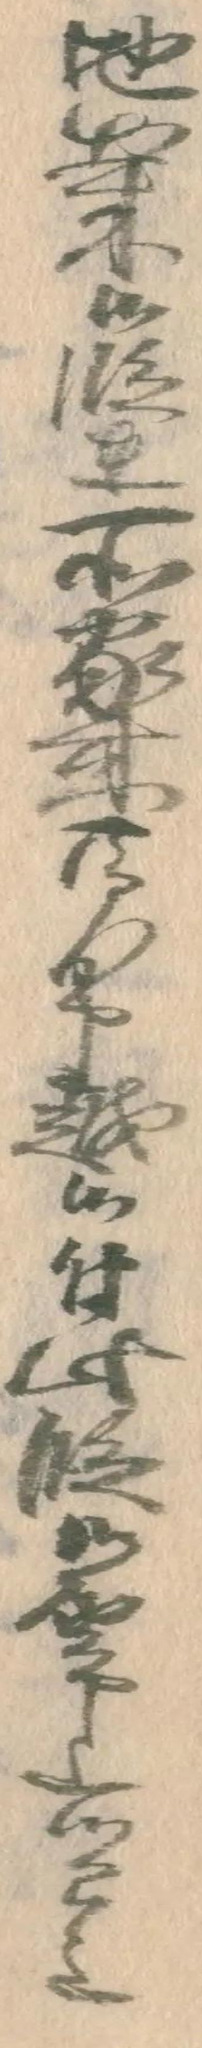地出来候段在所家来ゟ申越候付此段御届申上候已上
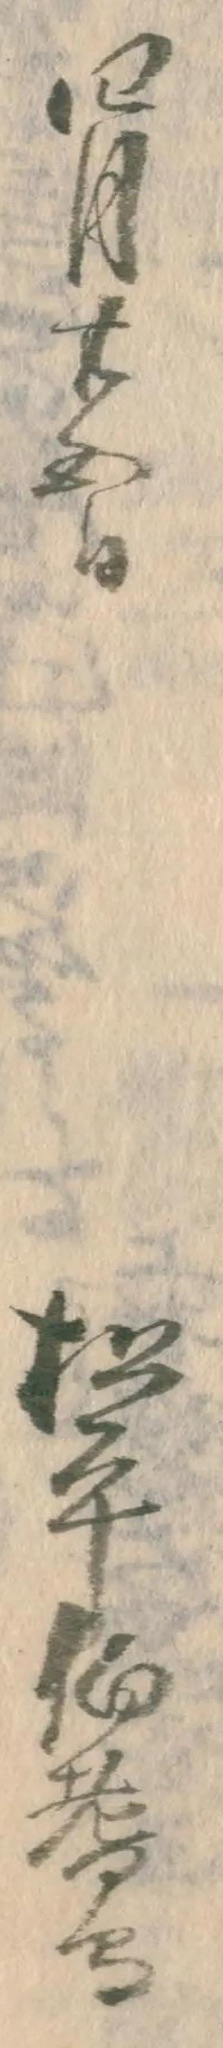四月廿五日松平伯耆守
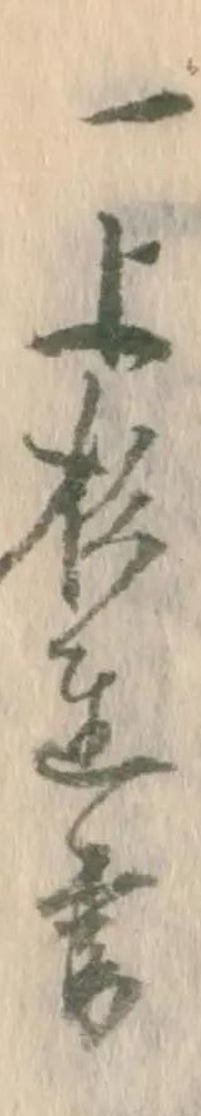一上杉達書
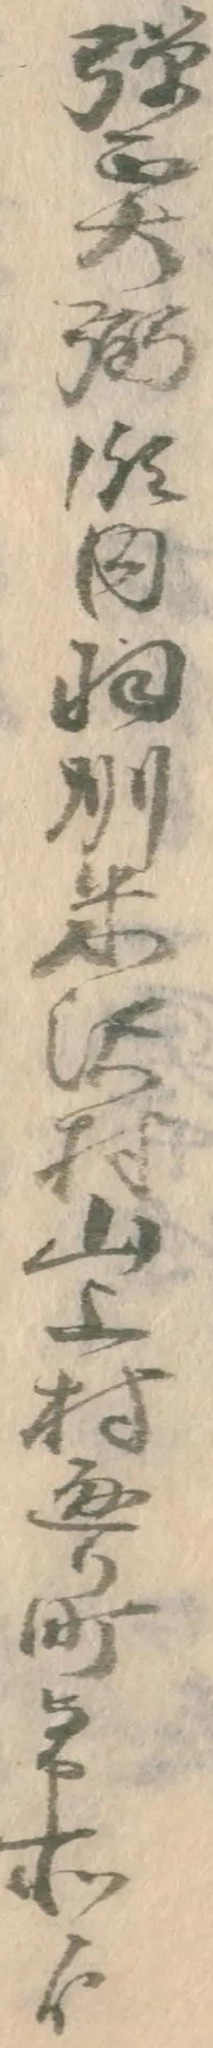弾正大弼領内羽州米沢村山上村通り町と申所ゟ
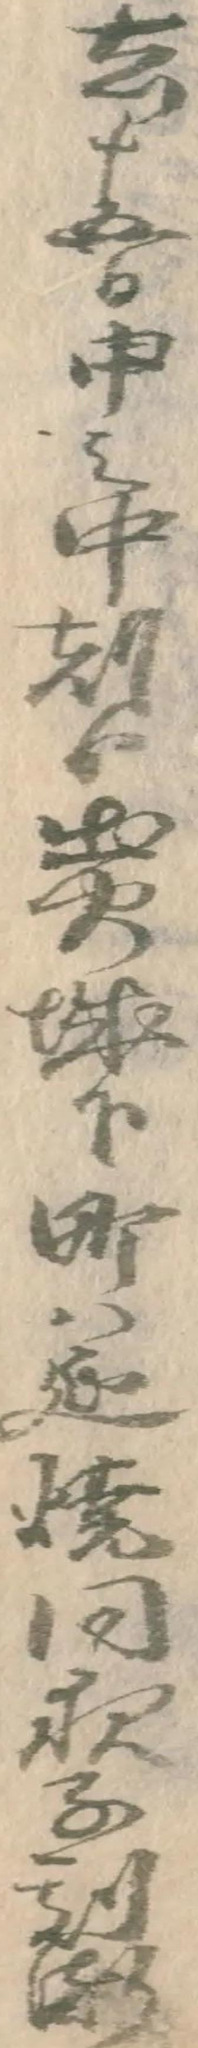去十五日申之中刻ゟ出火城下町ハ延焼同夜子刻漸
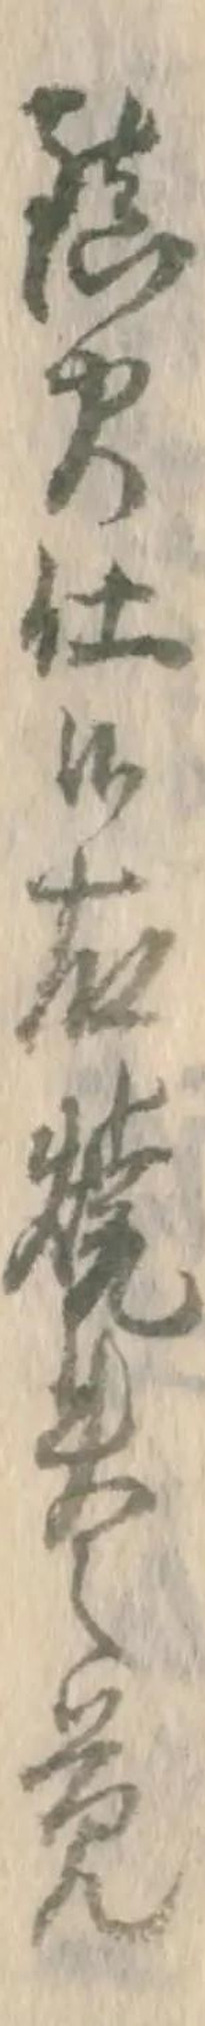鎮火仕候右焼失之覚

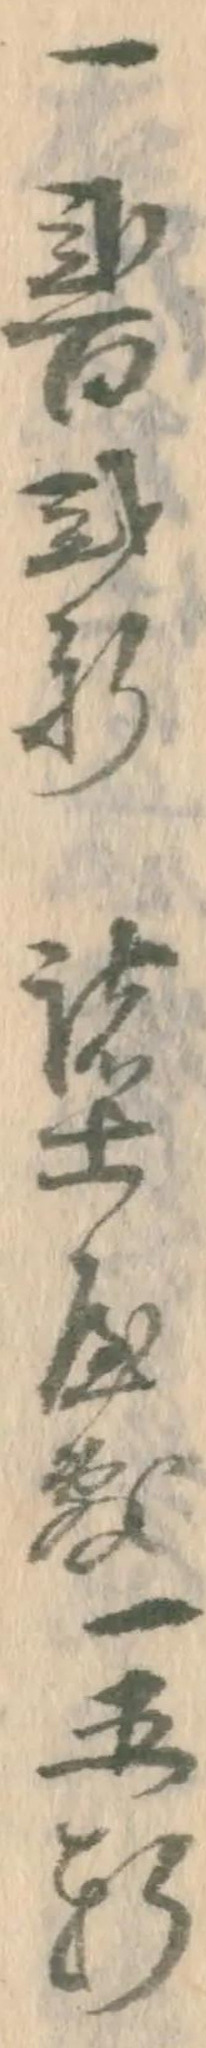一弐百弐軒諸士屋敷一五軒寺院
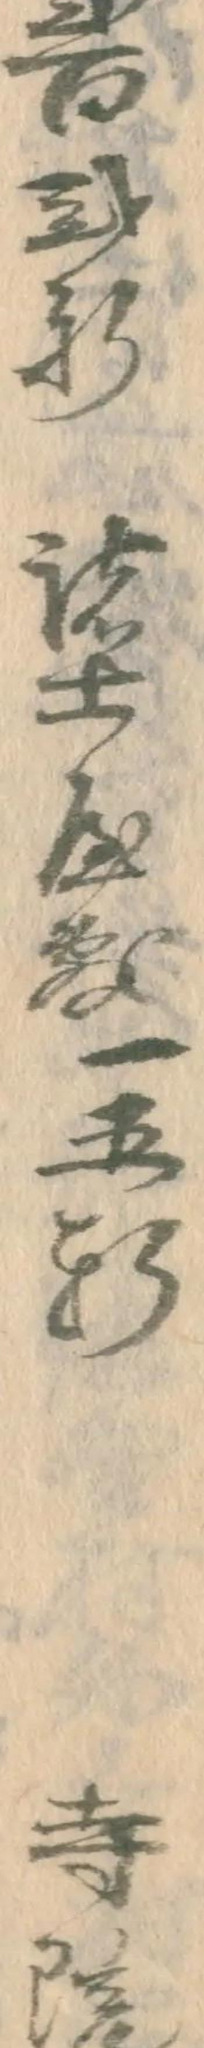一弐百弐軒諸士屋敷一五軒寺院
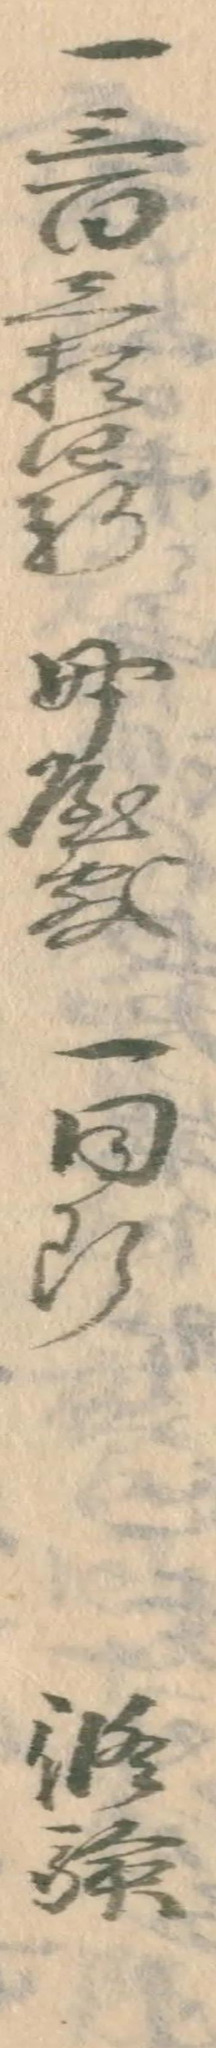一三百三拾四軒町屋敷一同断修験
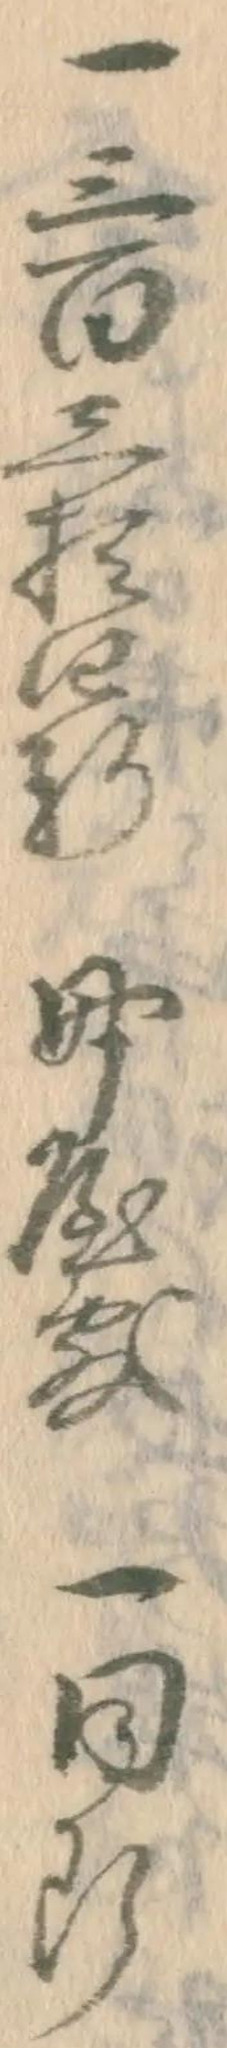一三百三拾四軒町屋敷一同断修験
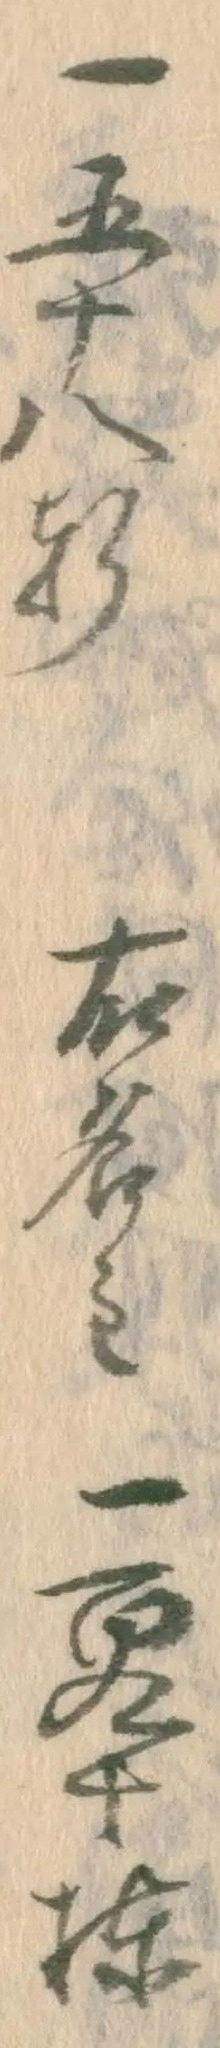一五十八軒右名主一百九十棟土蔵
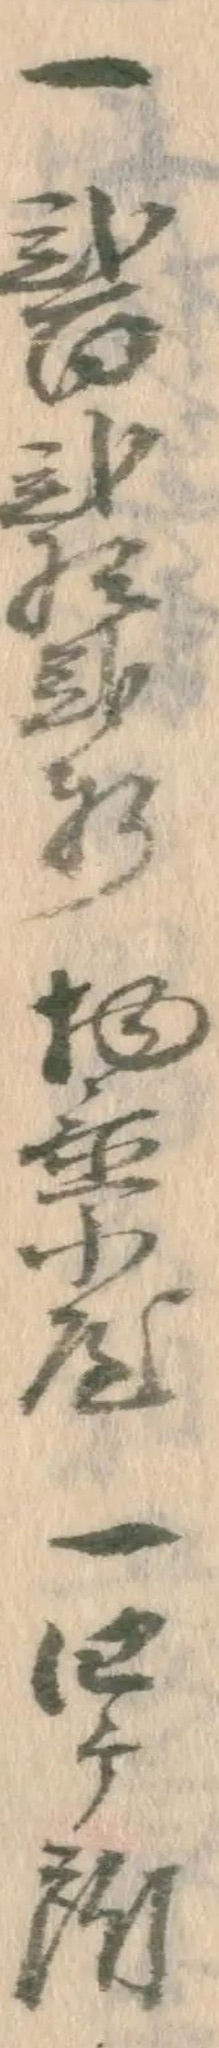一弐百弐拾弐軒物置小屋一四ヶ所堂社
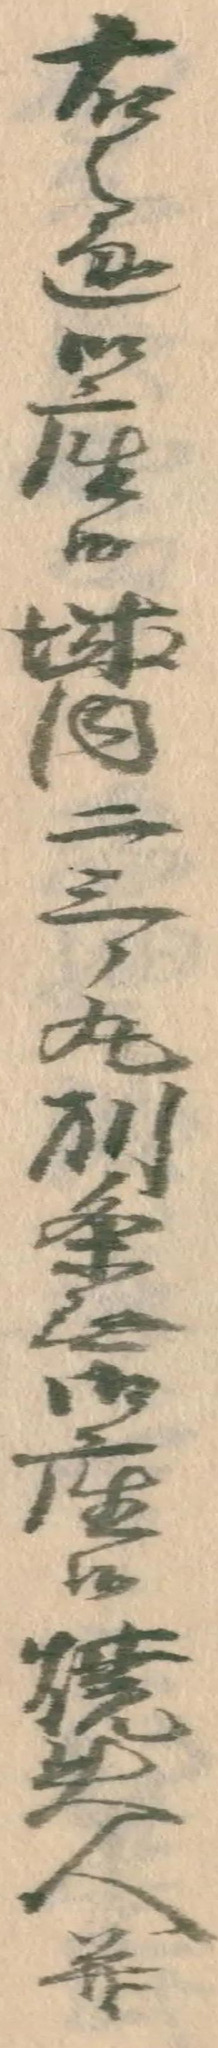右之通御座候城内二三ノ丸別条無御座候焼失人并
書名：信州大地震之記
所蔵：国立国会図書館 National Diet Library, JAPAN
